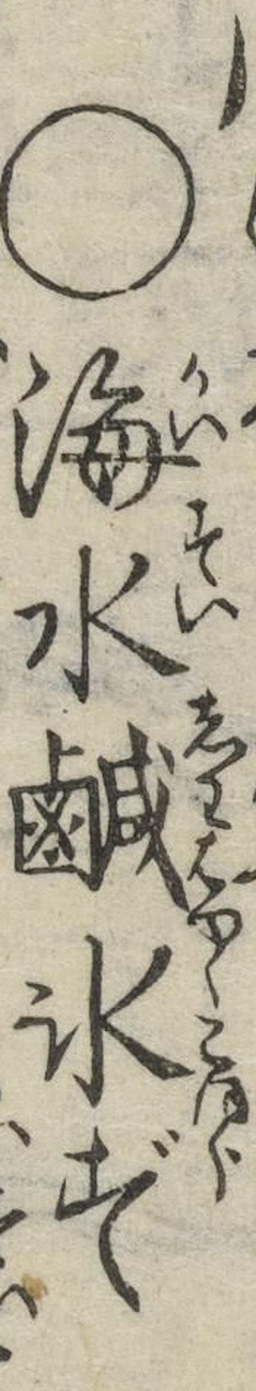○海水鹹氷ず
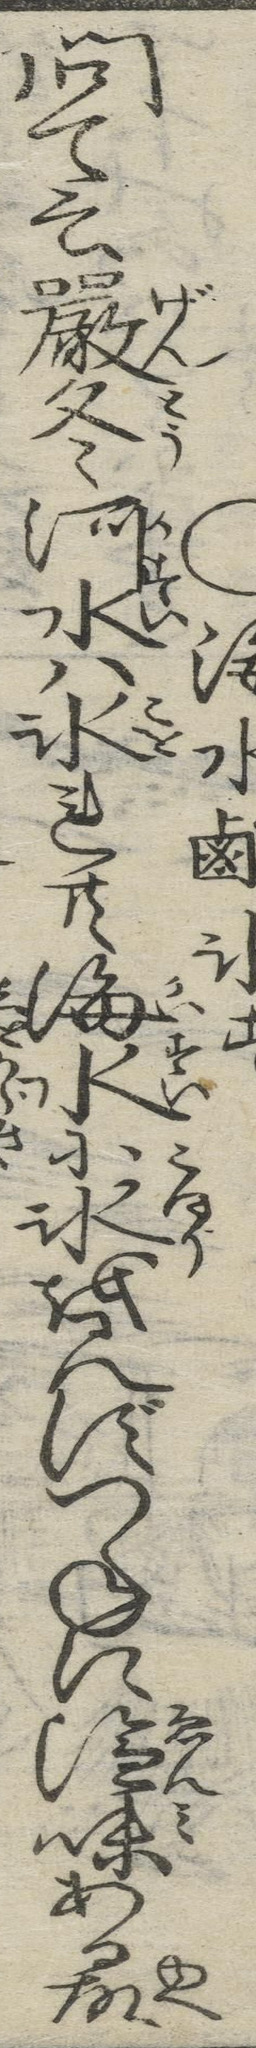問て云厳冬河水氷れども海水に氷をへずつねに塩味ある故
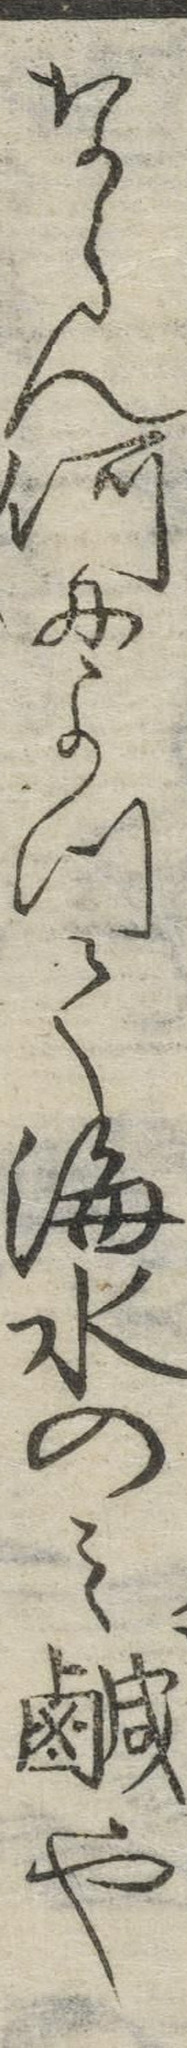ならん何によつて海水のみ鹹や
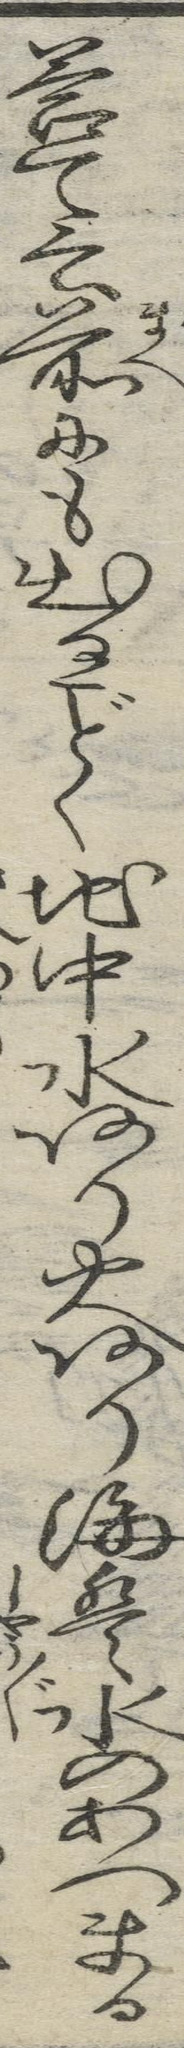答て云前にも出るごとく地中水あり火あり海は水のあつまる
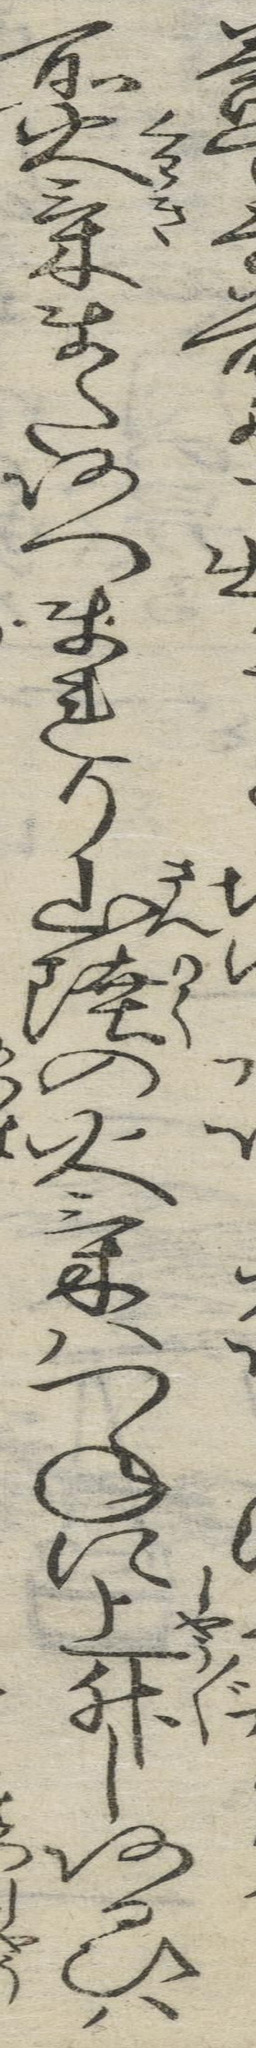所火気またあつまれり山陸の火気はつねに上昇しあるひは
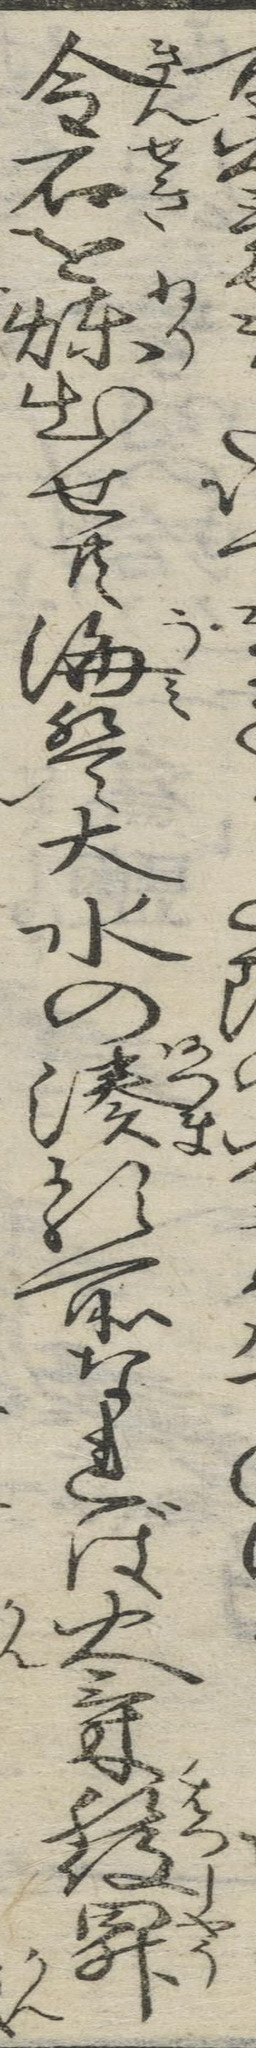金石を煉出せども海は大水の湊る所なれば火気発昇
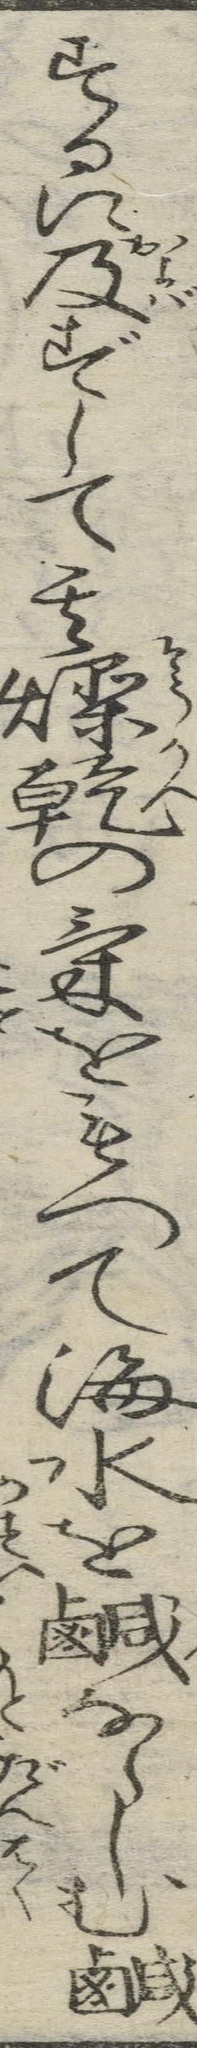するに及ずして其燥乾の気をもつて海水を鹹ならしむ鹹
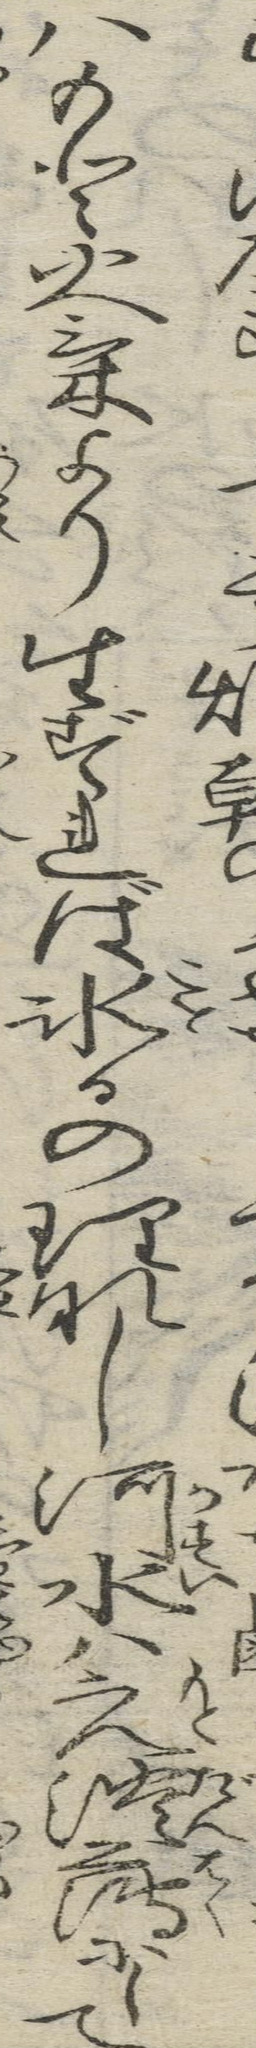はもと火気より生ずれば氷るの理なし河水は元淡薄にして
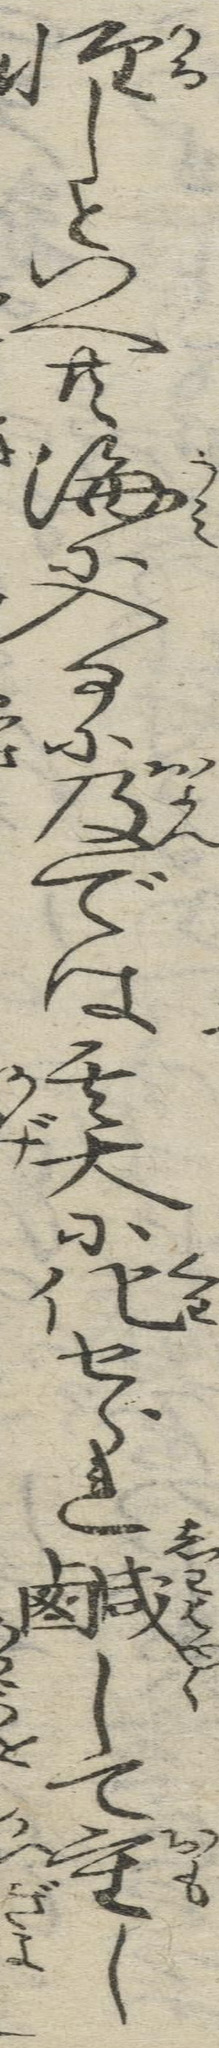軽しといへども海に入るに及では其大に化せられ鹹して重し
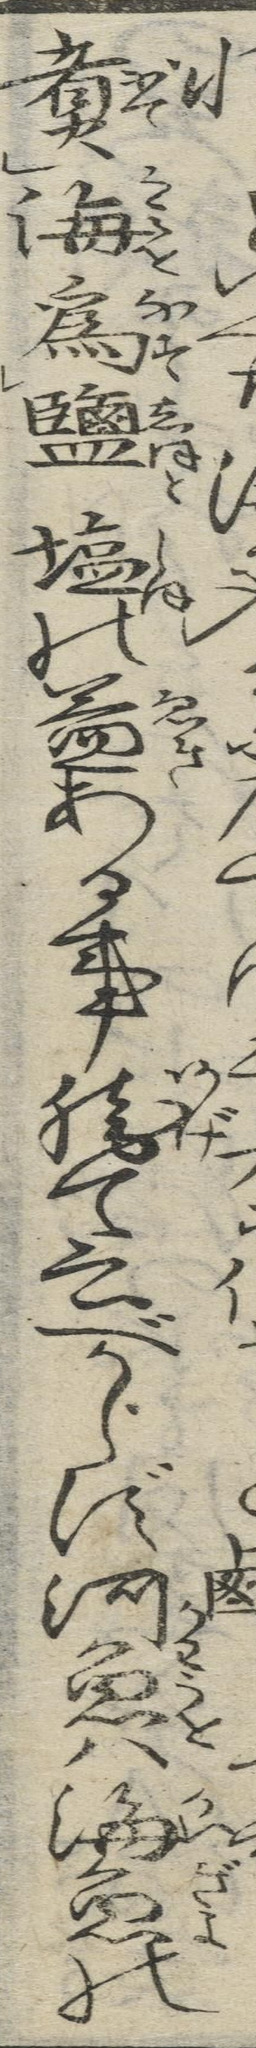煮海為鹽塩の益ある事勝て云べからず河魚は海魚の
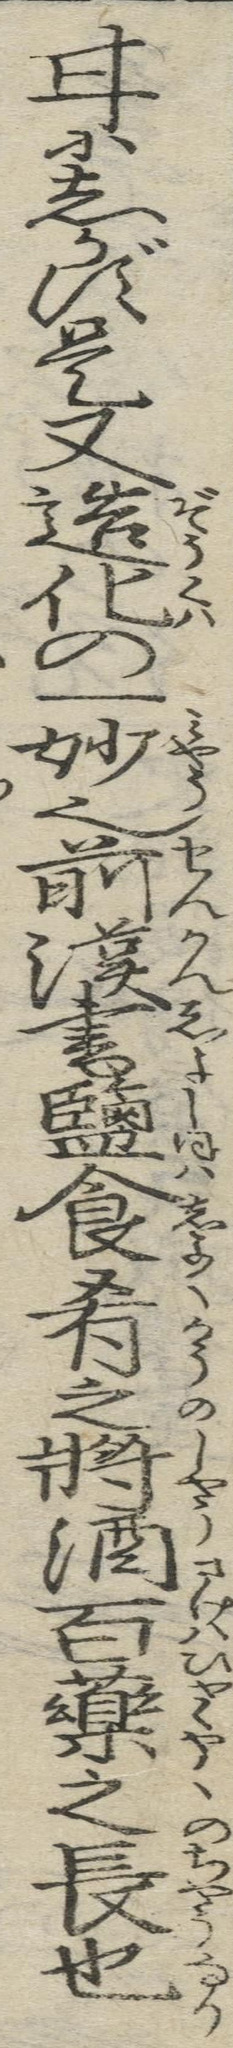甘にしかず是又造化の一妙也前漢書鹽食肴之将酒百薬之長也
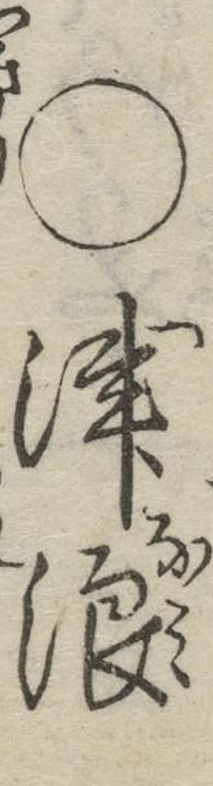○津浪
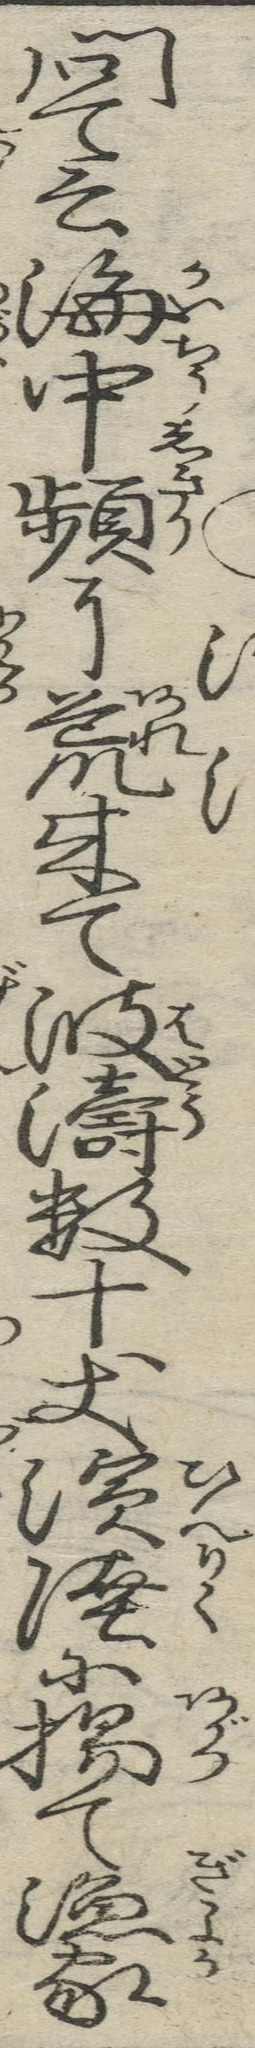問て云海中頻に荒来て波濤数十丈浜陸に揚て漁家
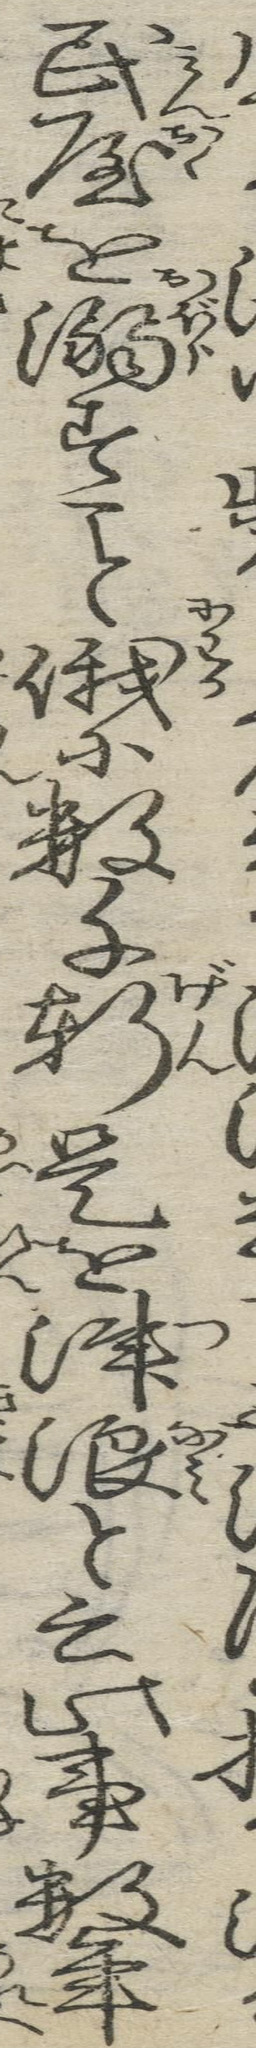民屋を溺すこと俄に数千軒是を津浪と云此事数年
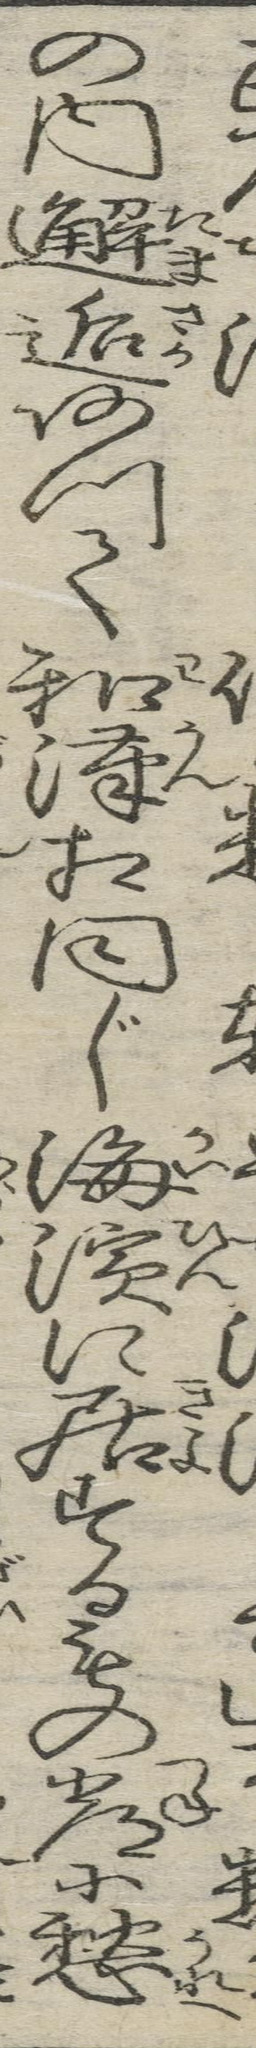の内邂逅あつて和漢相同じ海浜に居するもの常に愁
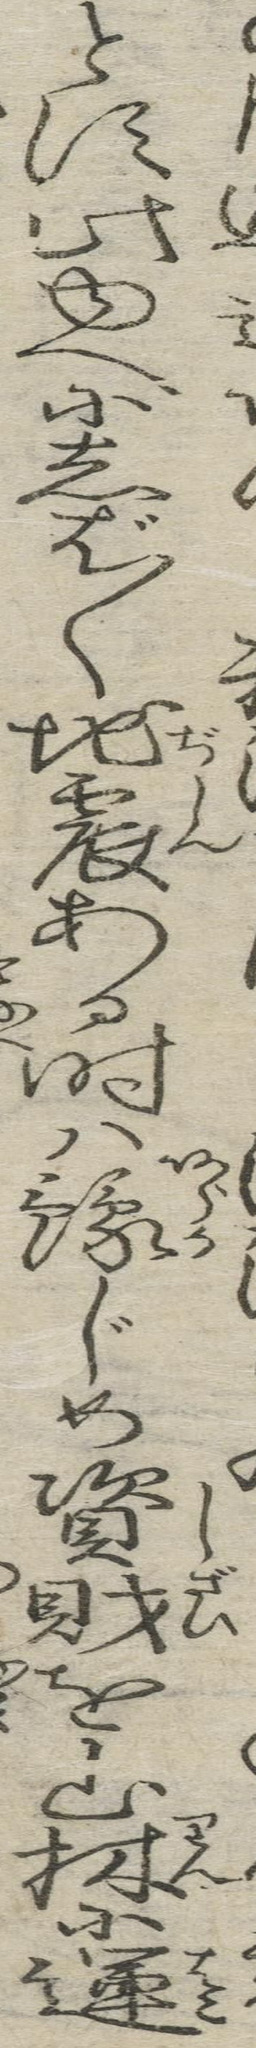とす此ゆへにしば〳〵地震ある時は豫じめ資財を山林に運
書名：訓蒙天地辨　地
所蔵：東京大学地震研究所図書室 Earthquake Research Institute Library, The University of Tokyo, JAPAN
